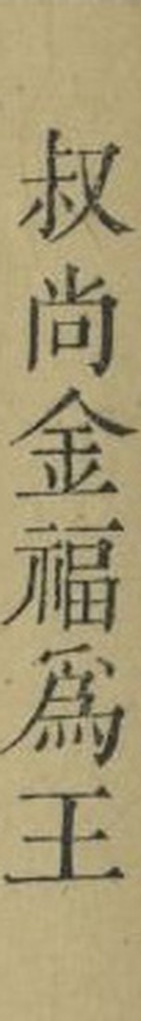叔尚金福為王
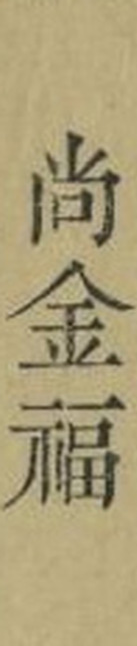尚金福
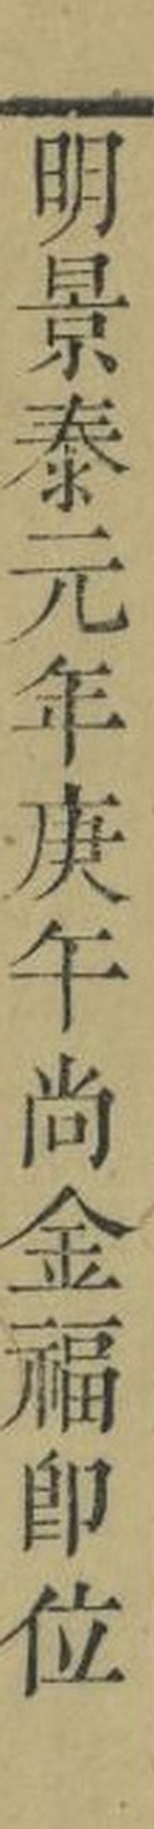明景泰元年庚午尚金福即位
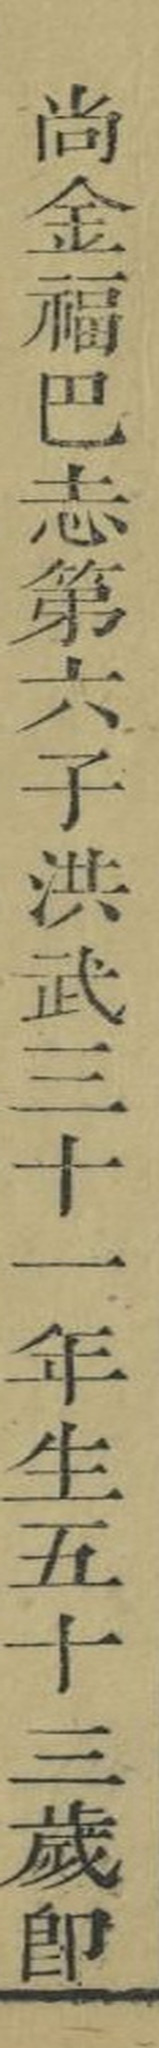尚金福巴志第六子洪武三十一年生五十三歳即
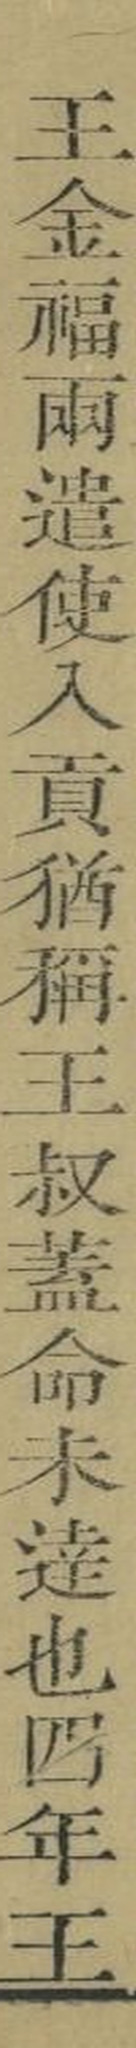王金福両遣使入貢猶称王叔蓋命未達也四年王
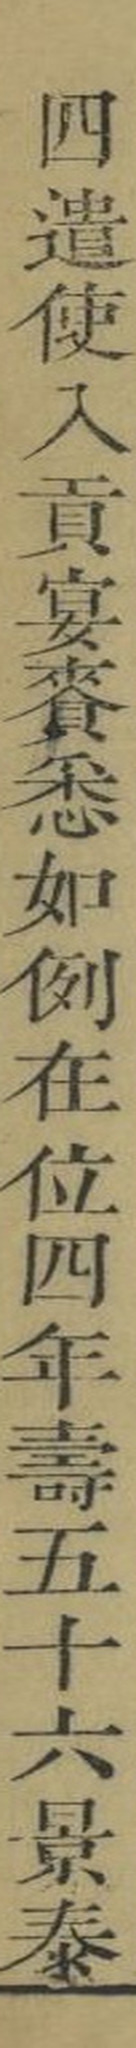四遣使入貢宴賚悉如例在位四年寿五十六景泰

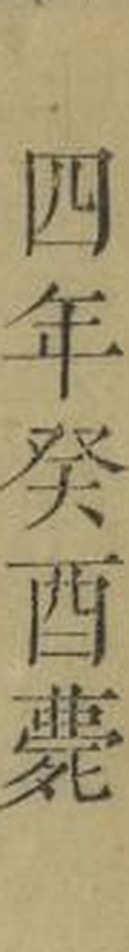四年癸酉薨
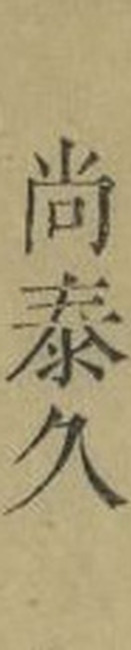尚泰久
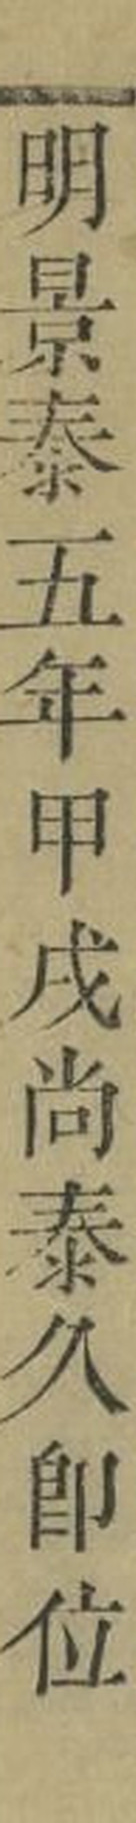明景泰五年甲戌尚泰久即位
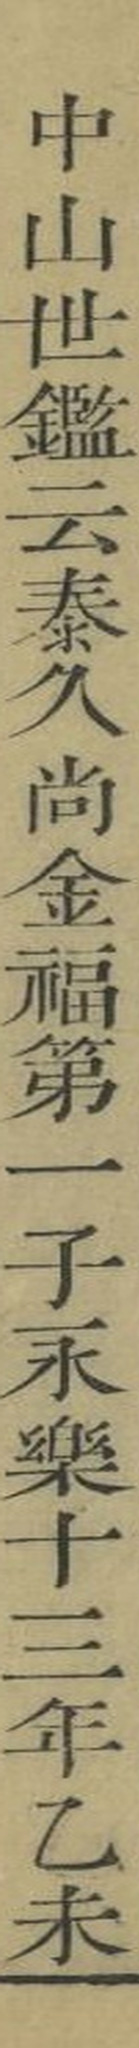中山世鑑云泰久尚金福第一子永楽十三年乙未
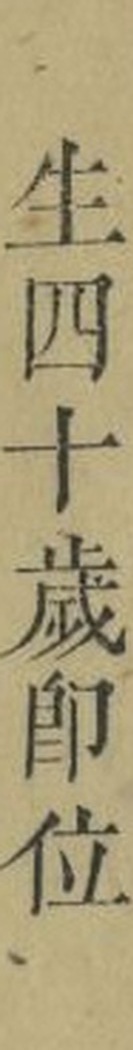生四十歳即位
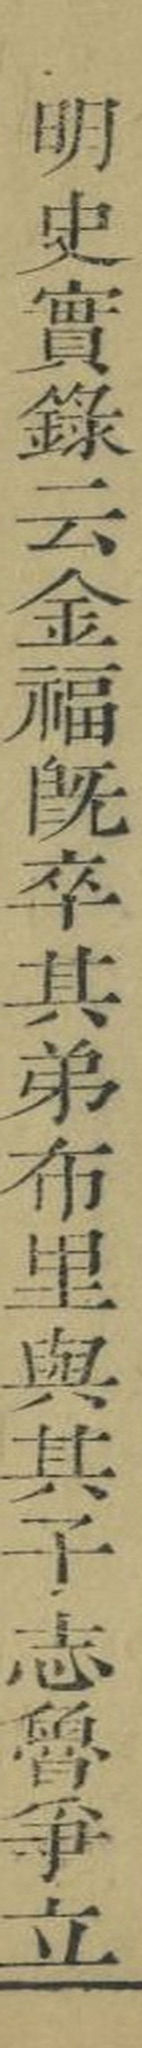明史実録云金福既卒其弟布里与其子志魯争立
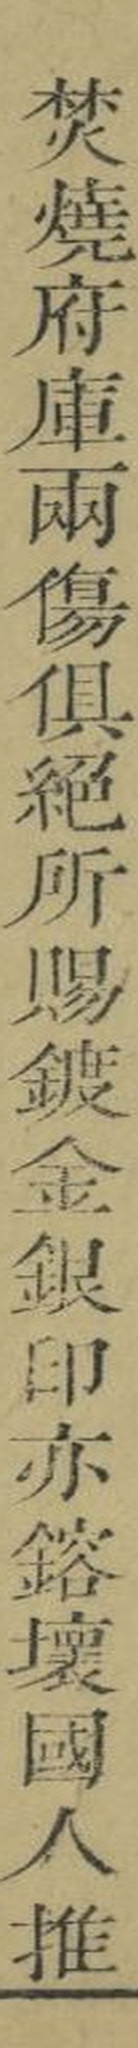焚焼府庫両傷俱絶所賜鍍金銀印亦鎔壊国人推
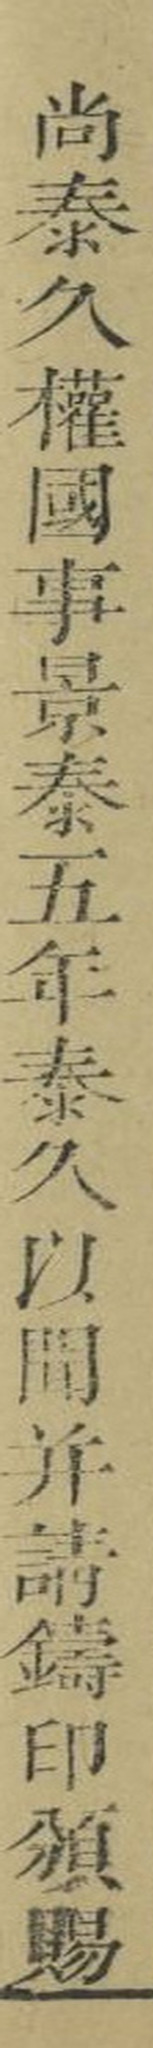尚泰久権国事景泰五年泰久以聞并請鋳印頒賜
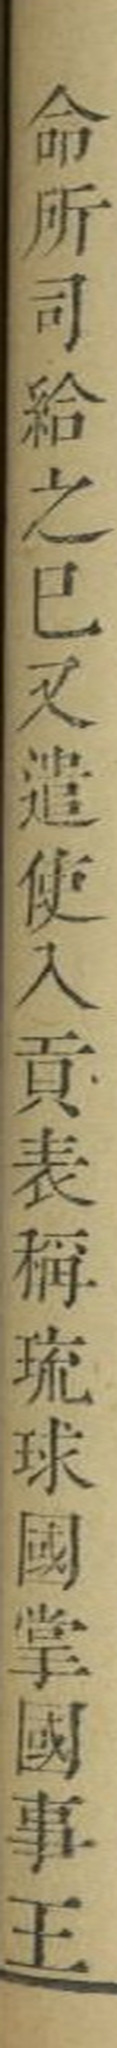命所司給之巳又遣使入貢表称琉球国掌国事王
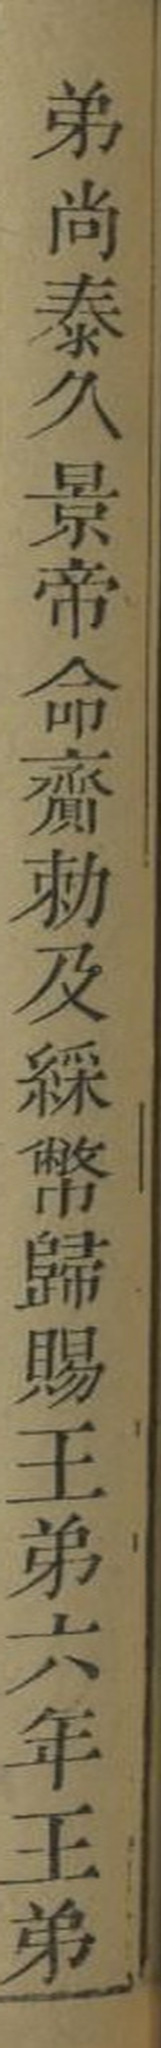弟尚泰久景帝命齎勅及綵幣帰賜王弟六年王弟
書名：中山伝信録 巻三
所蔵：University of the Ryukyus Library
